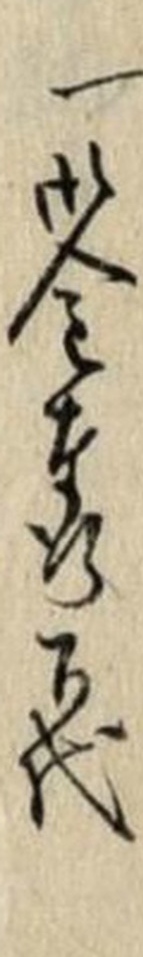御金奉行下代
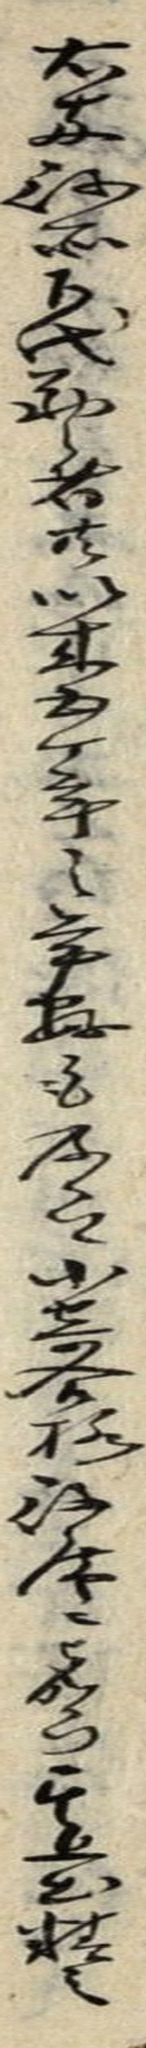右両役所下代勤之者共以来五ヶ年之年数にも及候はゝ小寄合格役席に被成下其上出精之
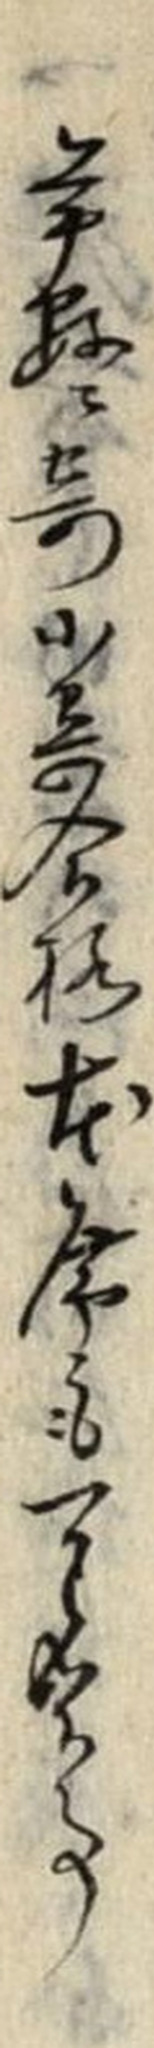年数に寄小寄合格本席にも可被成下事
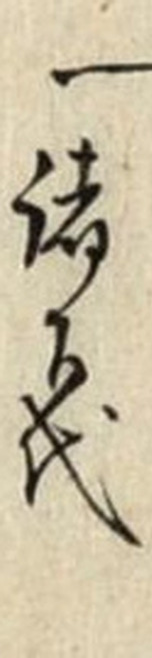諸下代
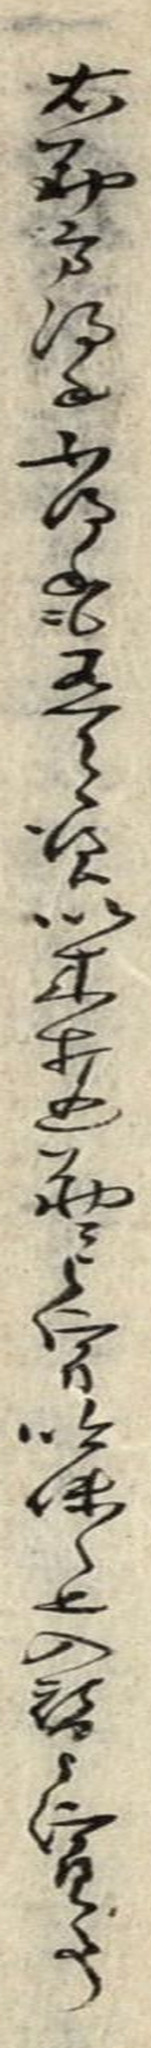右勤方得手不得手も有之候得は以来打込勤に被仰付吟味之上入替被仰付候事
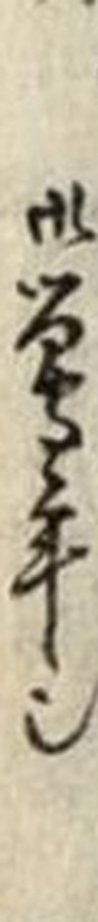御留守年也
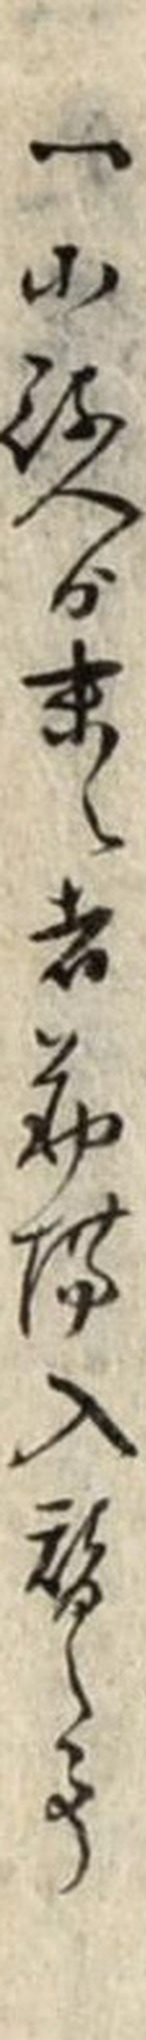一小役人ゟ未之者勤場入替之事
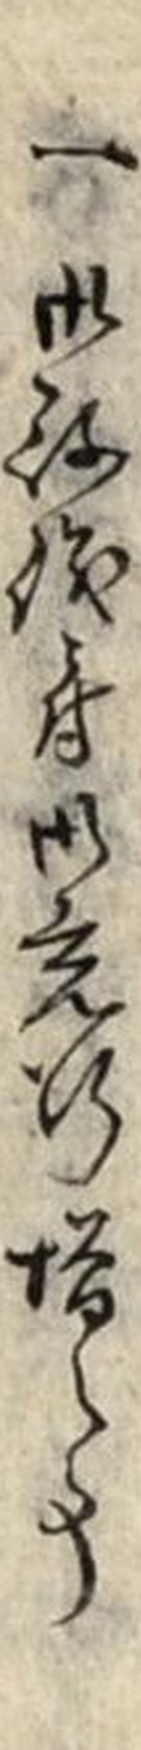一御役儀に付御充行増之事
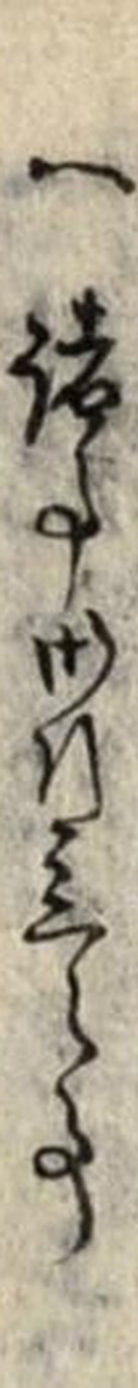一諸事御引立之事
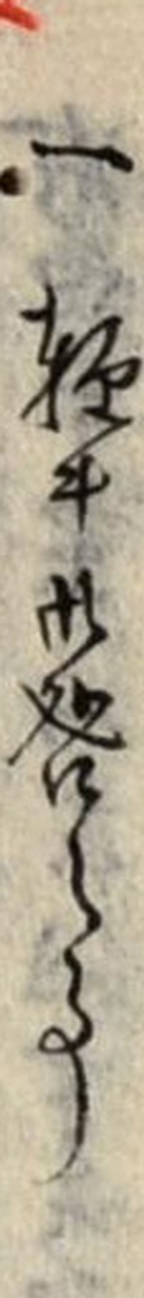一軽き御咎之事

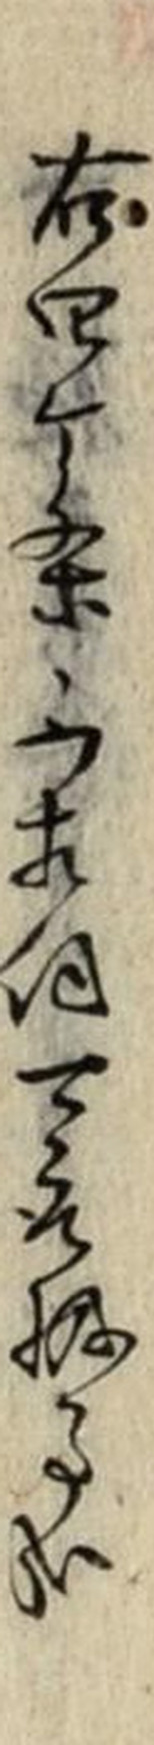右四ヶ条不相伺可取扱事哉
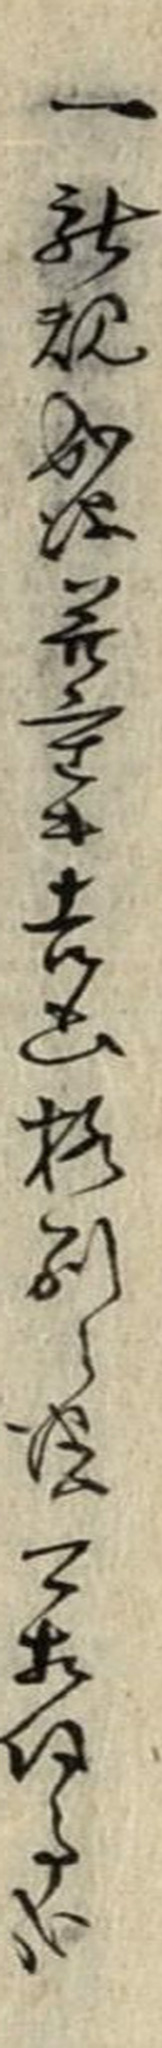一新規成儀并重き吉凶格別之儀は可相伺事哉
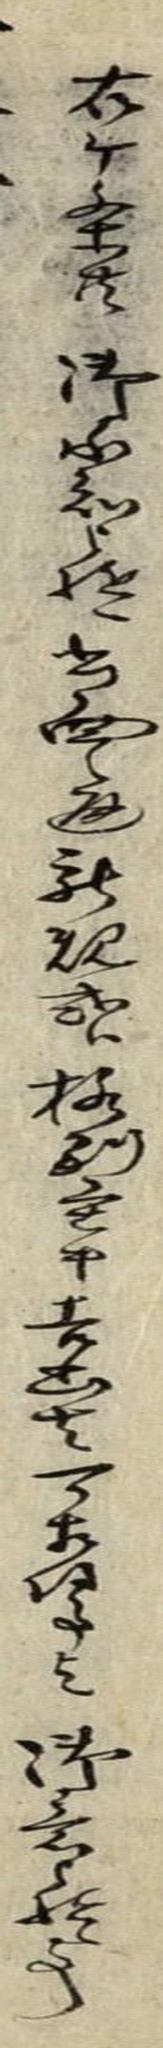右ヶ条共御承知被遊候書面之通新規或は格別重き吉凶は可相伺事と御意被遊候事
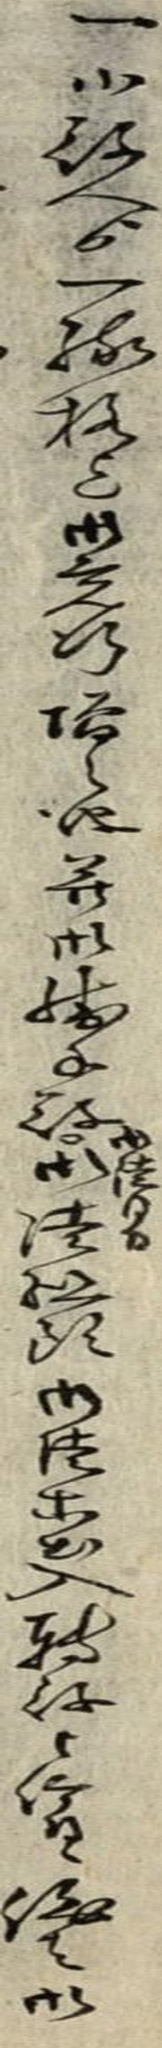一小役人ゟ一統格迄御充行増之儀并御勝手役御徒目付御徒組頭御徒等出入転役被仰付候儀は御
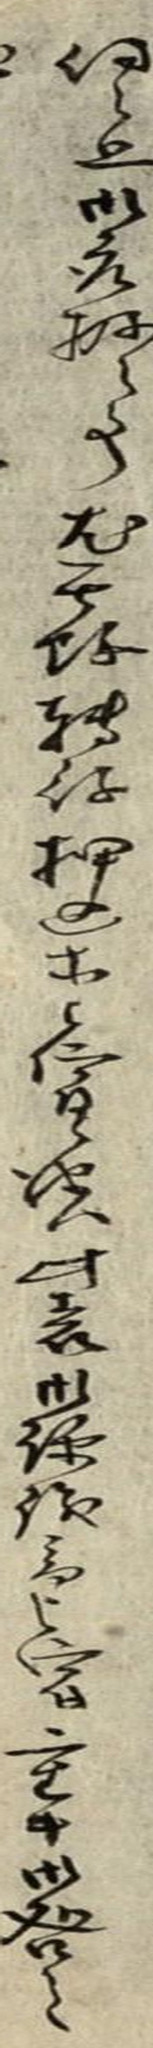伺之上御取扱候事尤其餘転役押込等被仰付候儀は此表御評議に而被仰付重き御咎之
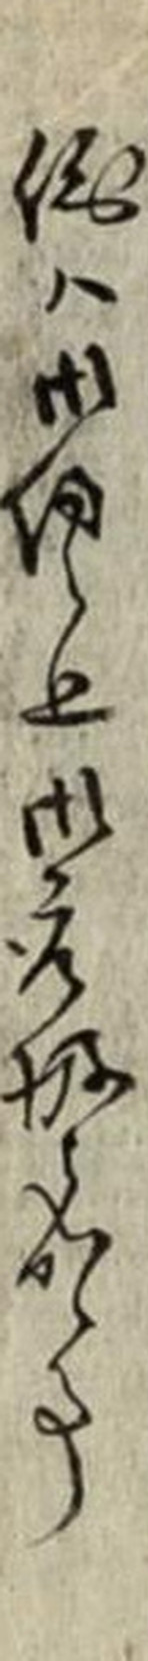儀は御伺之上御取扱被成候事
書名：御用并被仰出之部
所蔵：福井県文書館 Fukui Prefectural Archives
